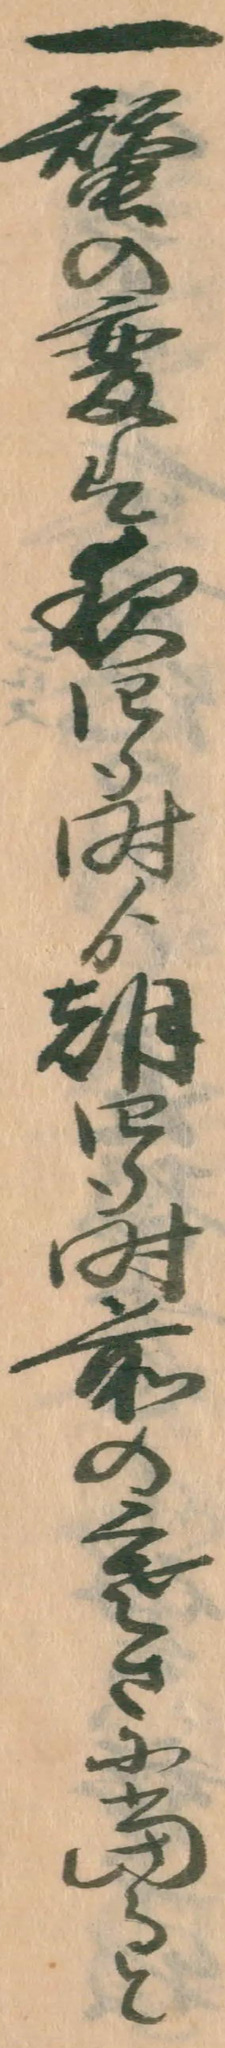一蚕の変は夜四つ時ゟ朝四つ時前の寒さに当ると
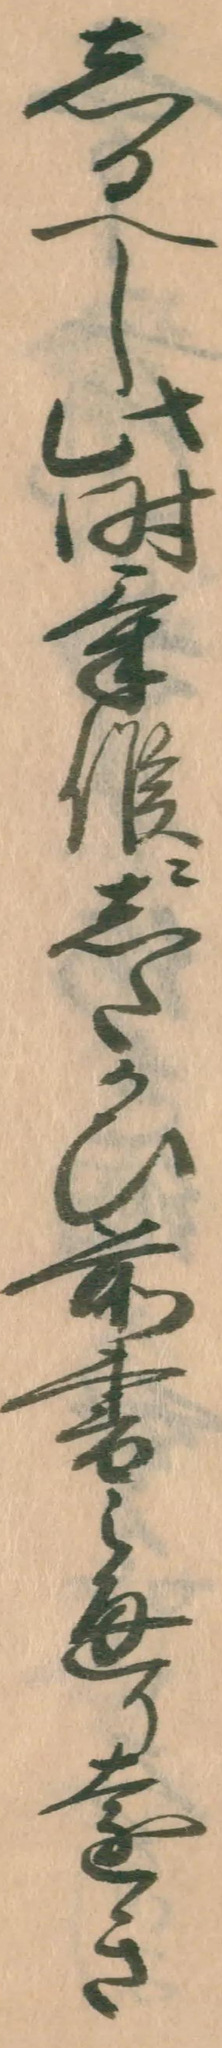しるへし此時気候にしたかひ前書之通り遠き
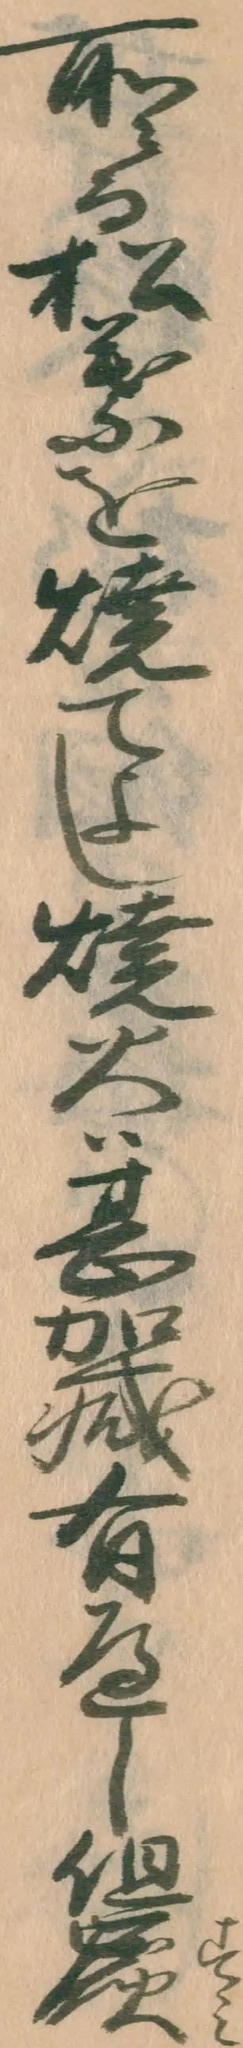所にて松葉を焼てよし焼火は甚加減有へし但炭
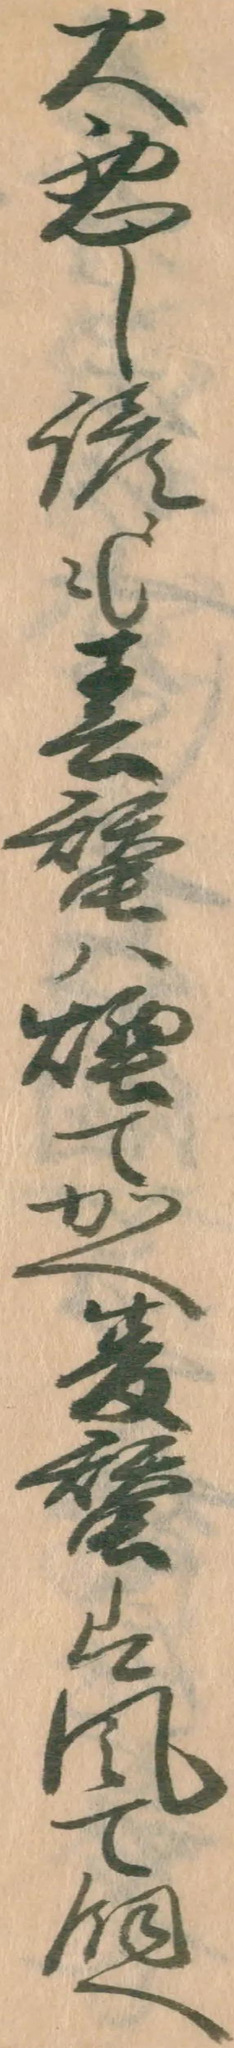大悪し諺も春蚕は煙てかへ夏蚕は風て飼へ
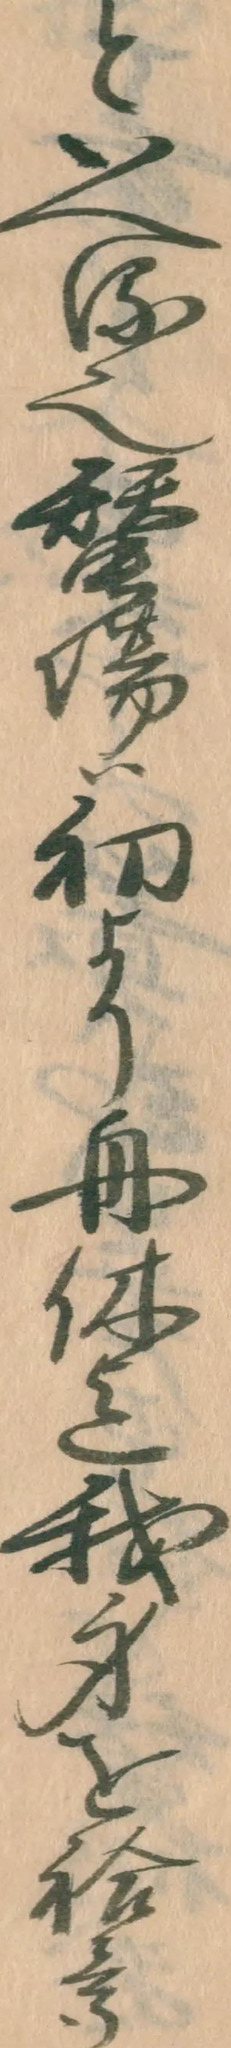といへる也蚕場は初より舟休迄我身を袷壱つ
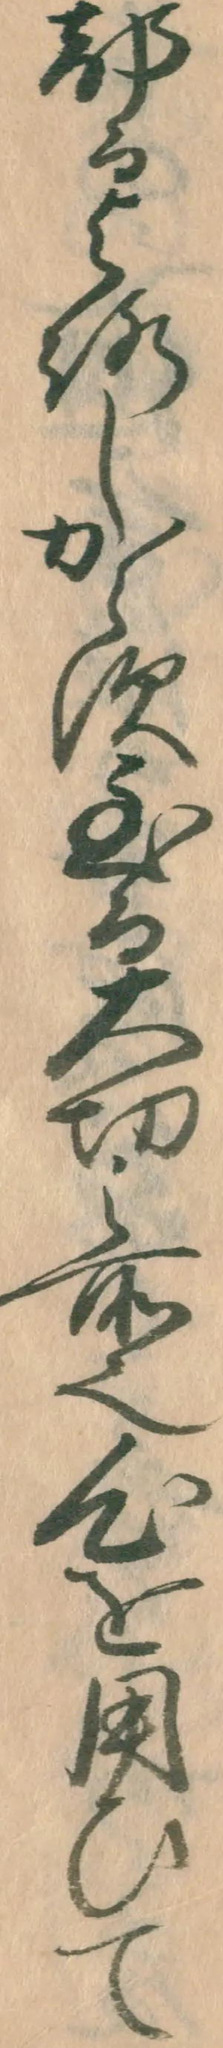都てよろしからす至て大切之所也心を用ひて
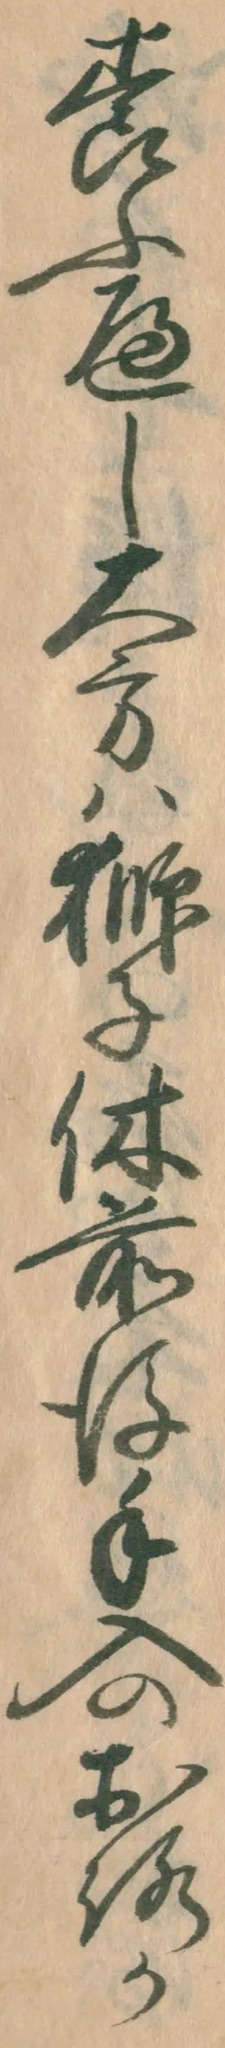養ふへし大方は獅子休前後手入のおろか

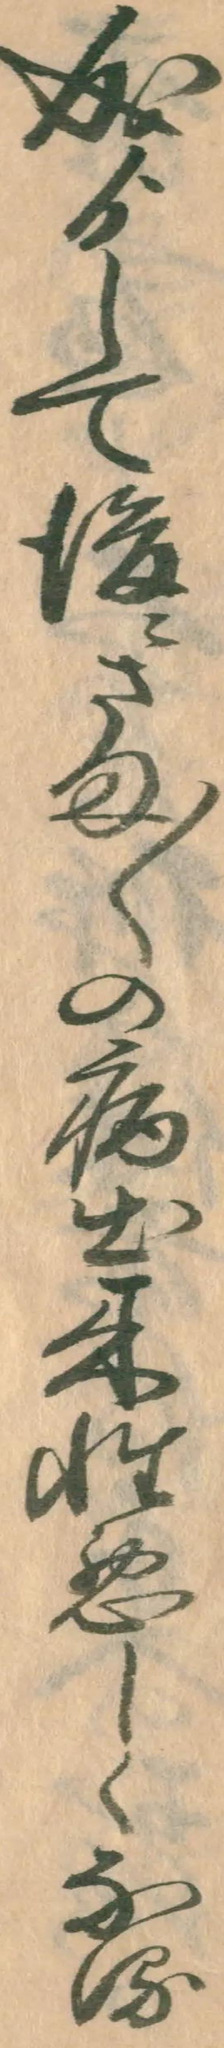成ゟして後にさま〳〵の病出来性悪しくなる
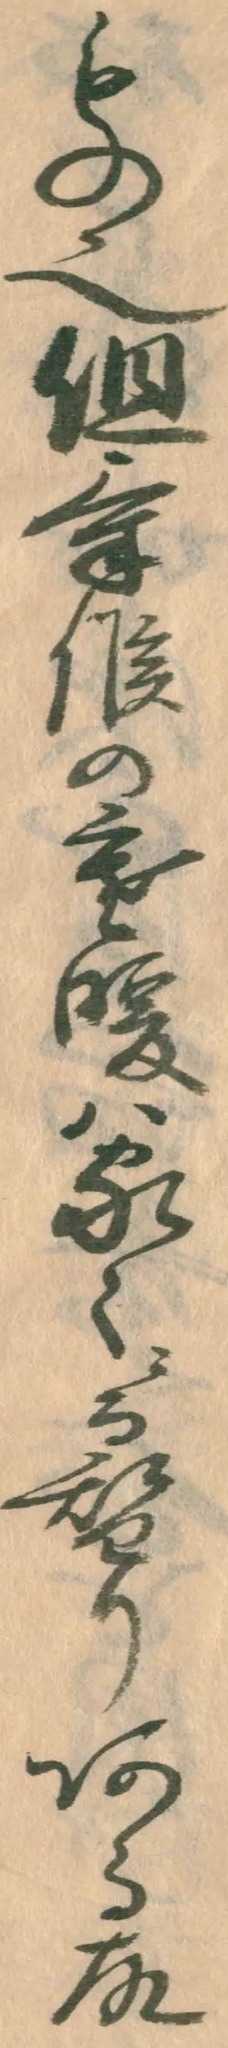もの也但気候の寒暖は家々にて替りある故
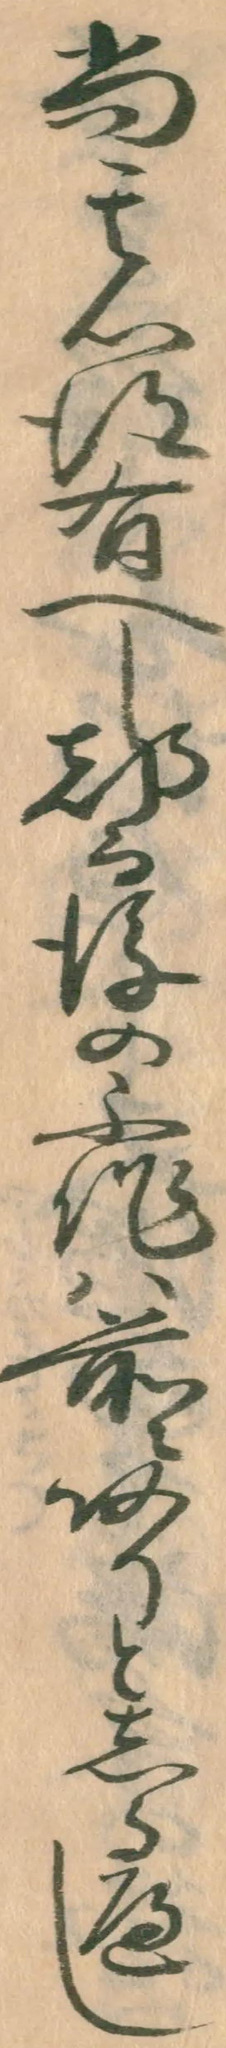尚其心得有へし都て後の不作は前にありとしるへし
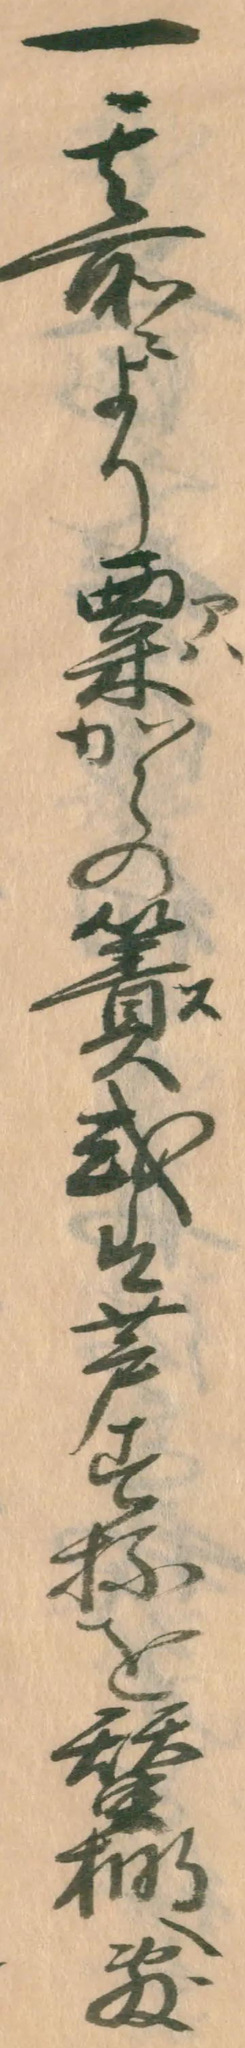一其前により粟からの簀或は芦す抔を蚕棚へ敷
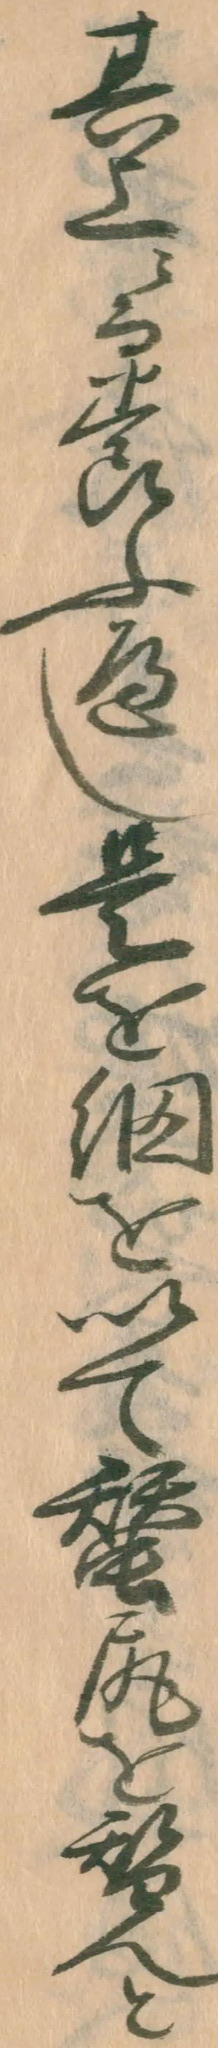其上にて養ふへし是を網を以て蚕尻を替んと
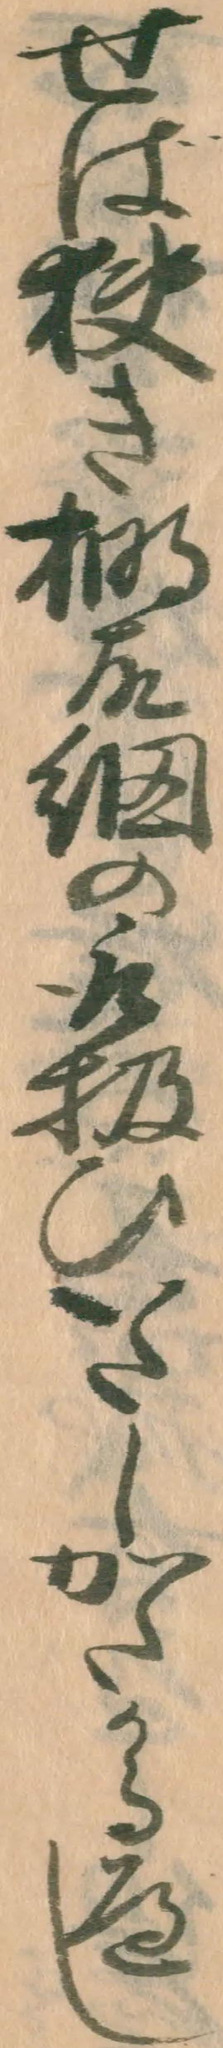せば狭き棚故網の取扱ひいたしかたかるへし
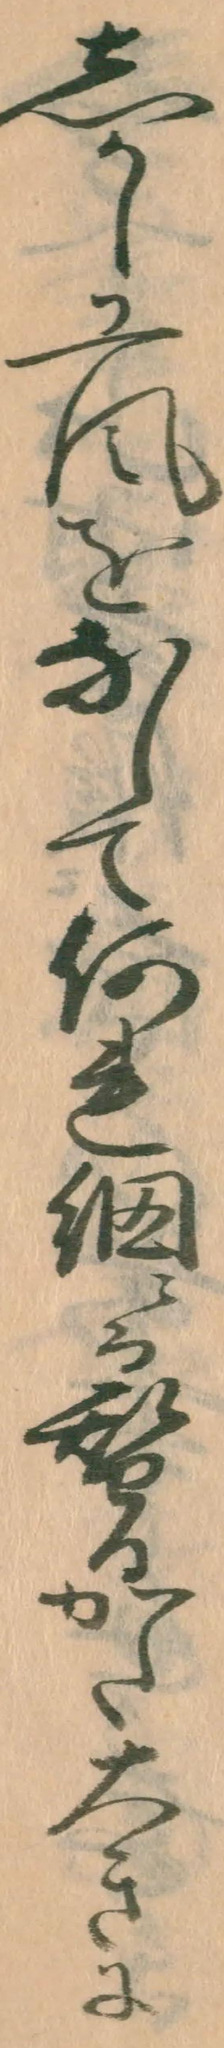しかし工風をなして何れ網にて替るかた大きに
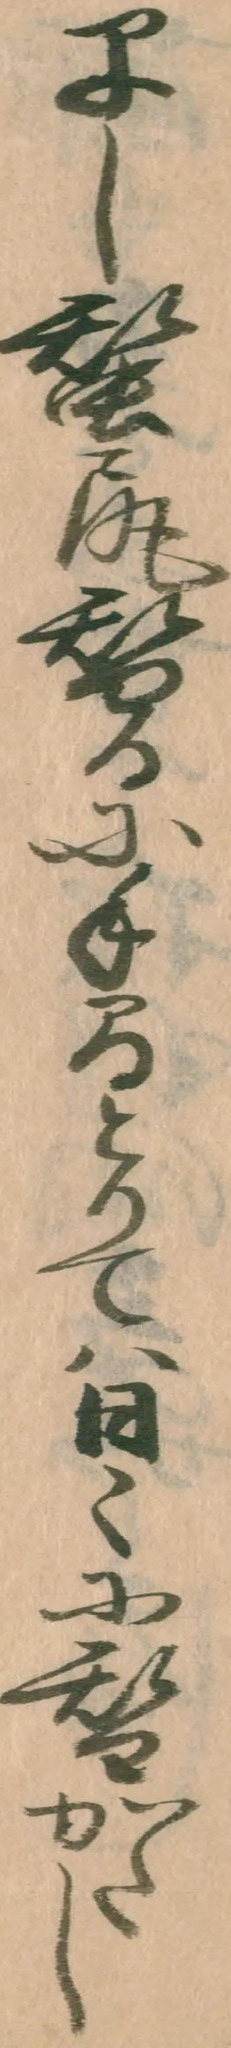早し蚕尻替るに手間とりては日々に替かたし
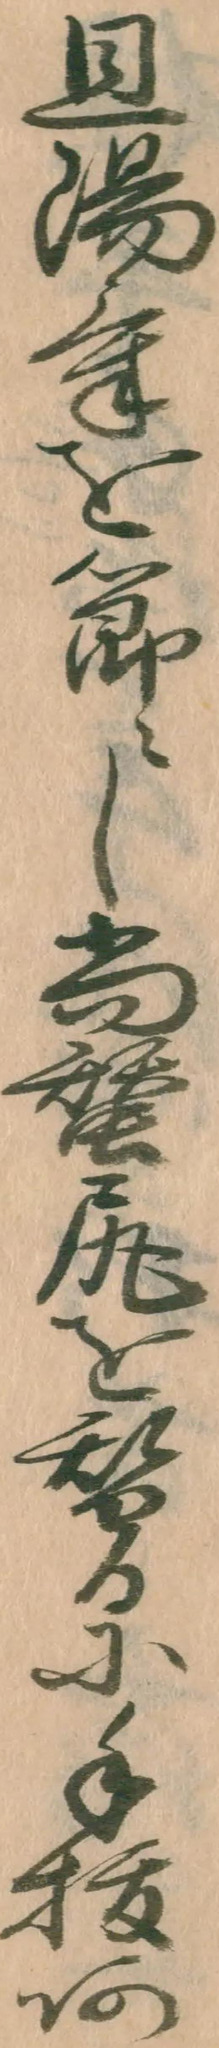且陽気を節にし尚蚕尻を替るに手抜あ
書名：養蚕録
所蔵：国立国会図書館 National Diet Library, JAPAN
